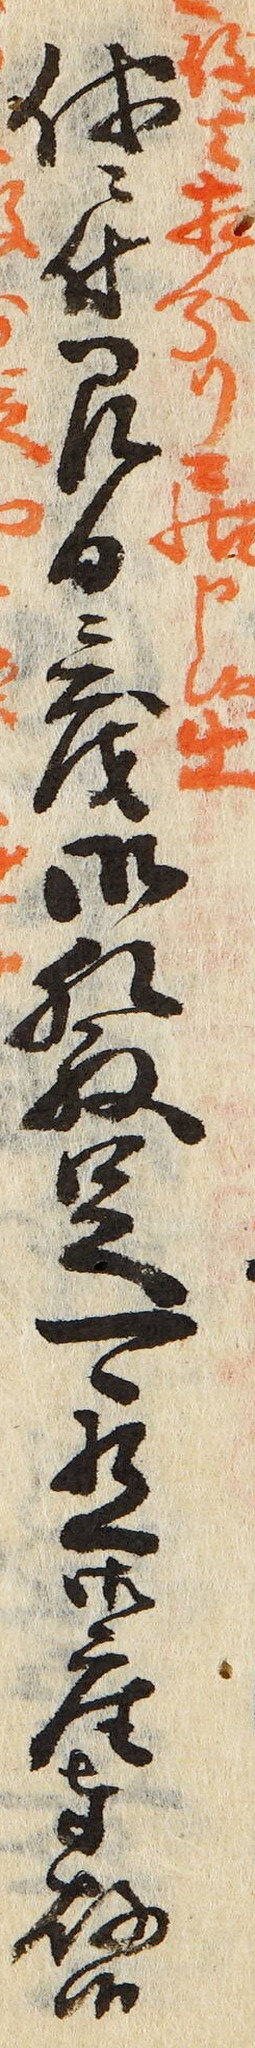体ニ付即日ニも御発足可有御座奉存候
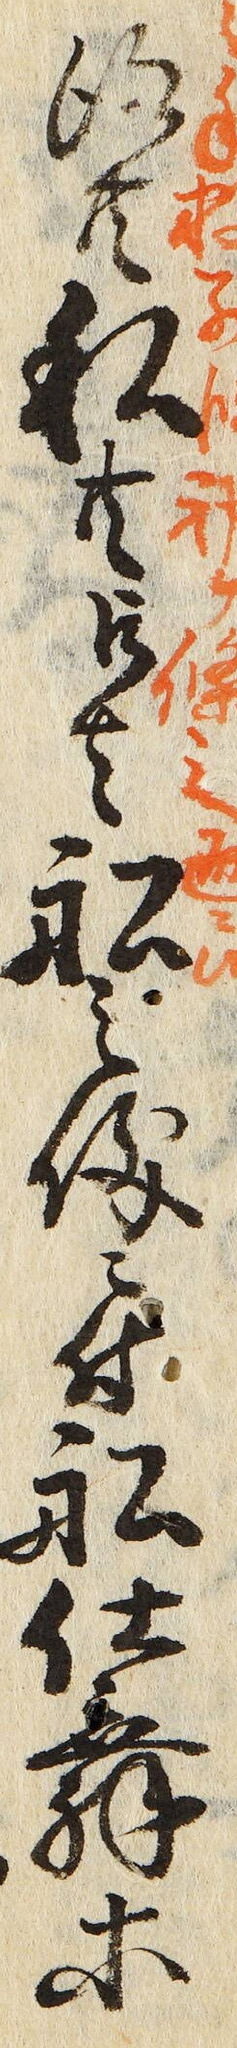得共私共江者船之儀ニ付舟仕舞等
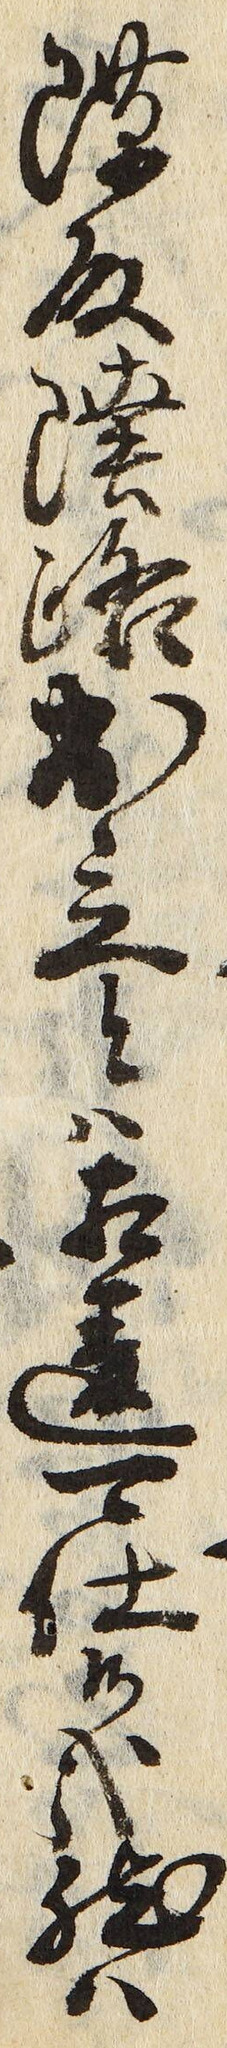障故陸路出立とハ相違可仕候哉然ハ
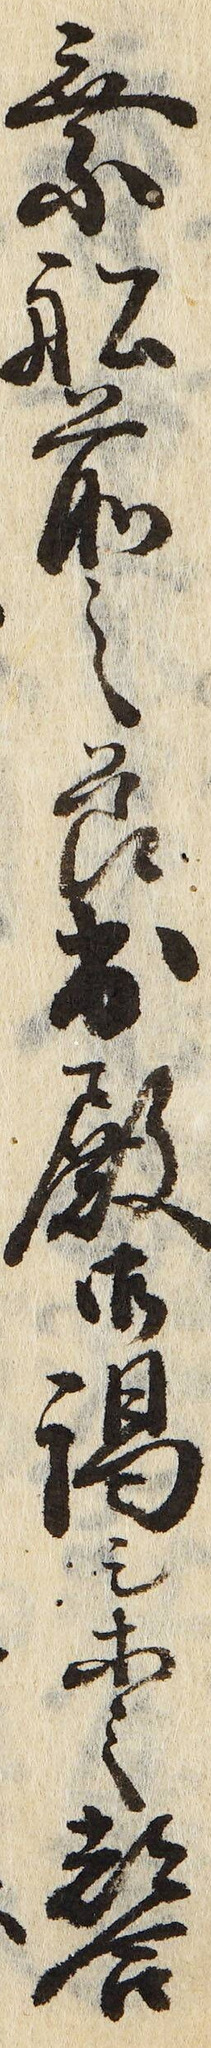乗船前之節出殿御謁シ等之都合
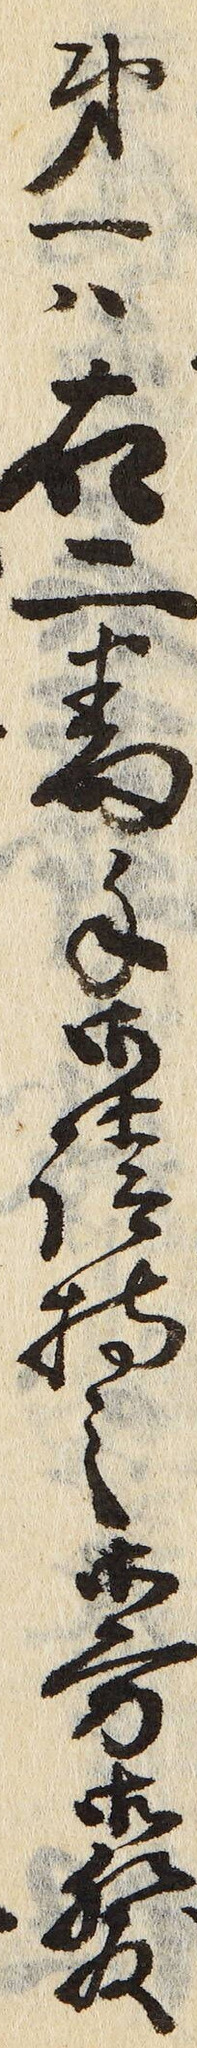第一ハ右二番手緒請持之御方御発
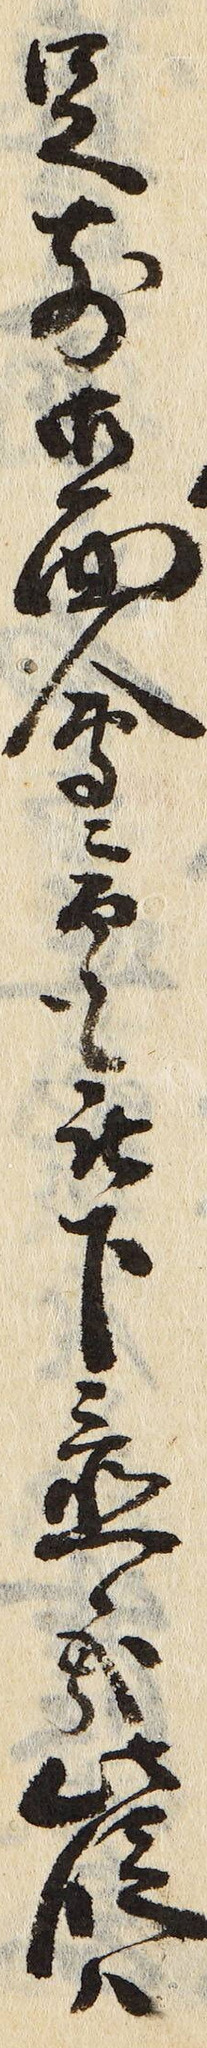足前御面会ニ而も被下置候哉此段ハ
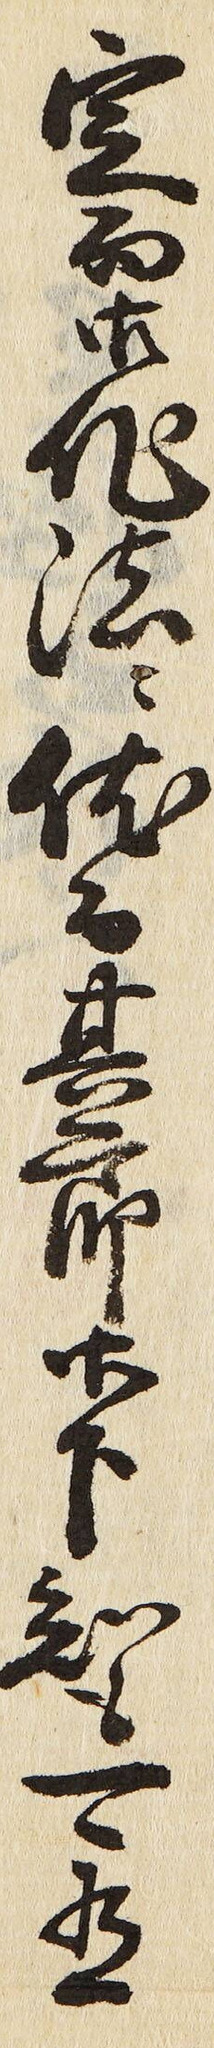定而御作法ニ依而其節御下知も可有
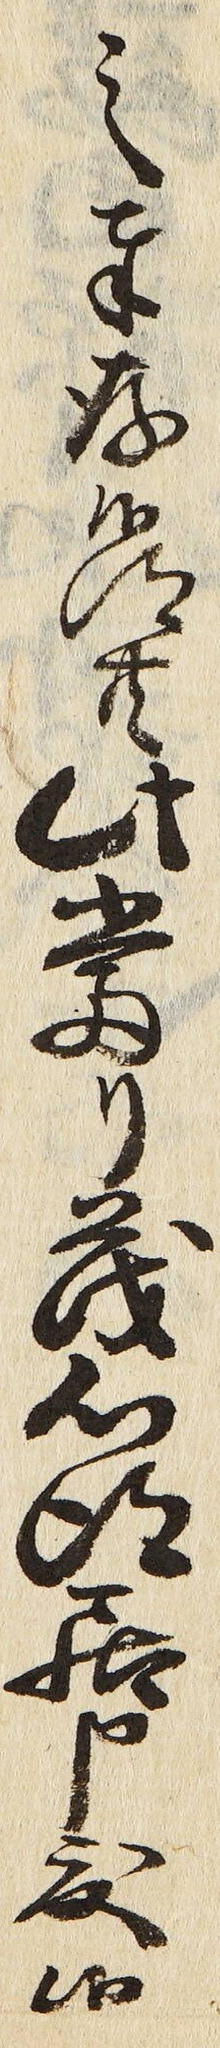之奉存候得共此当りも心得居申度候
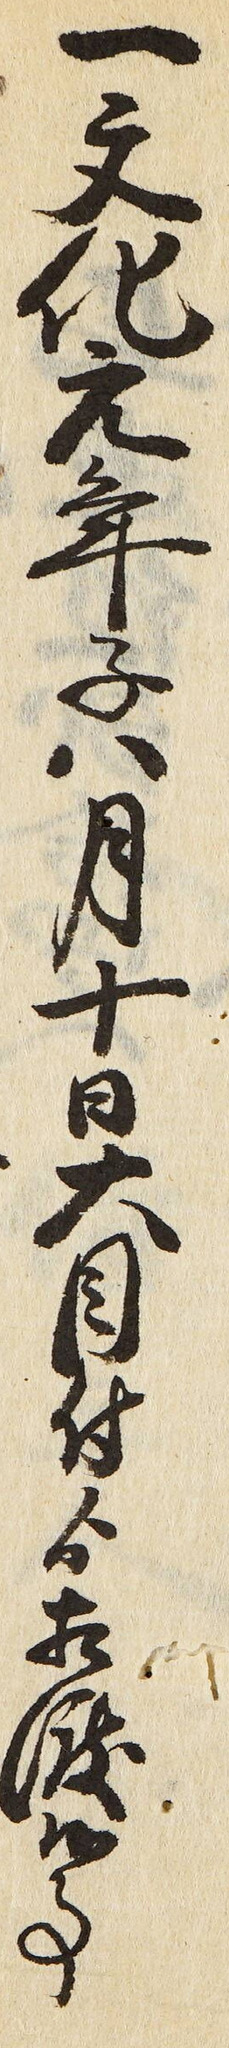一文化元年子八月十日大目付ゟ相渡候事
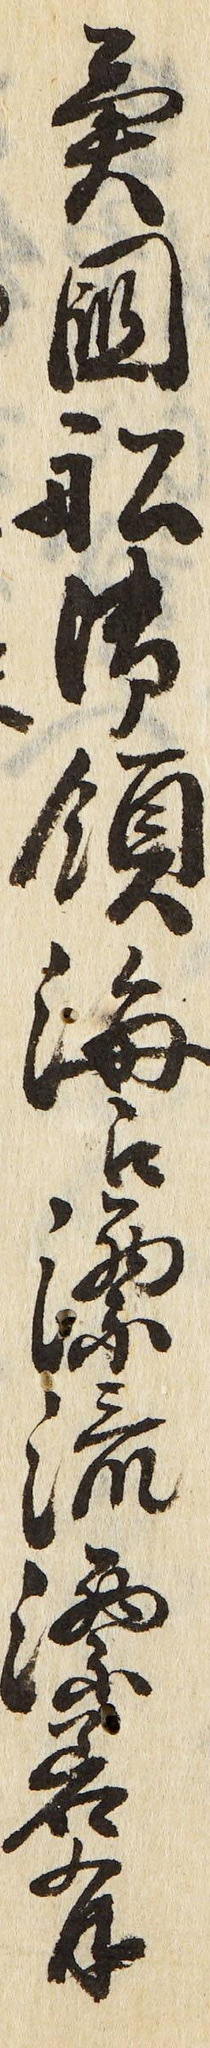異国船御領海江漂流漂着有
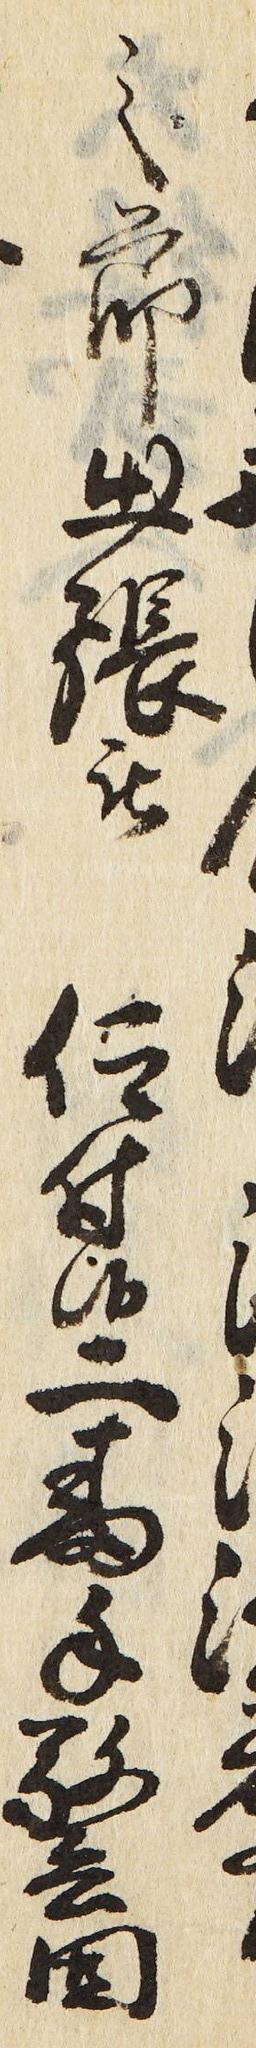之節出張被仰付候二番手警固
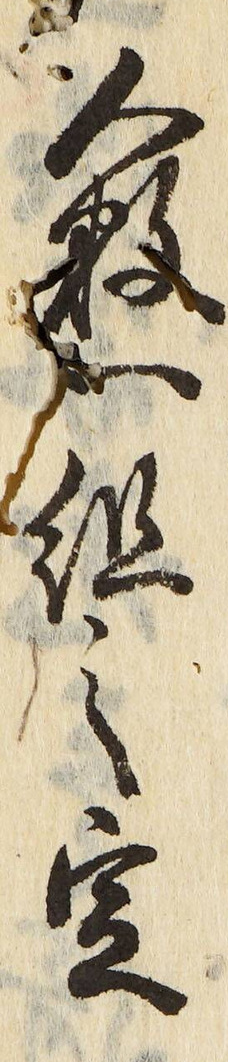人数一組之定

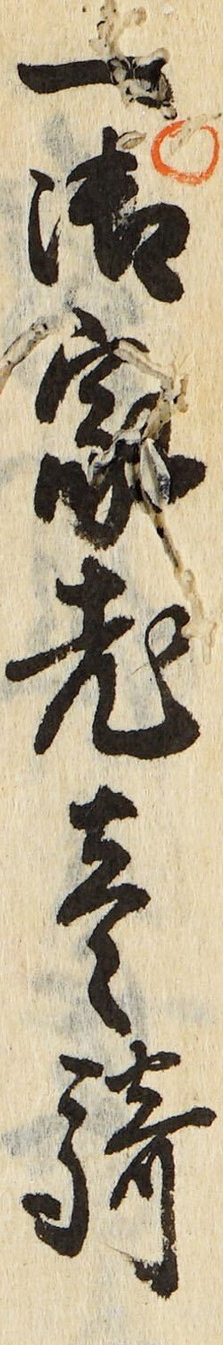一〇御家老壱騎
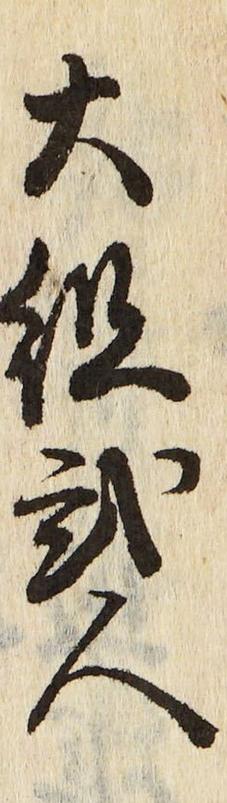大組弐人
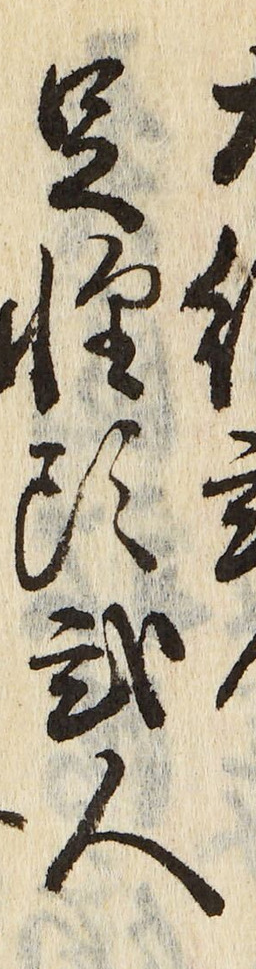足軽頭弐人
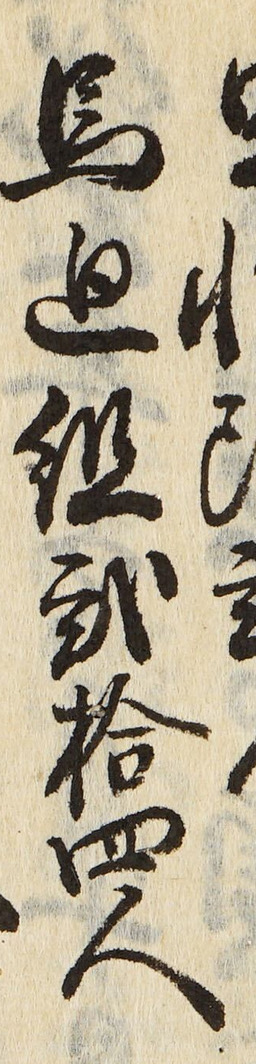馬廻組弐拾四人
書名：御領海江異国船漂流有之節御手当之次第大組頭心得之廉々書集記
